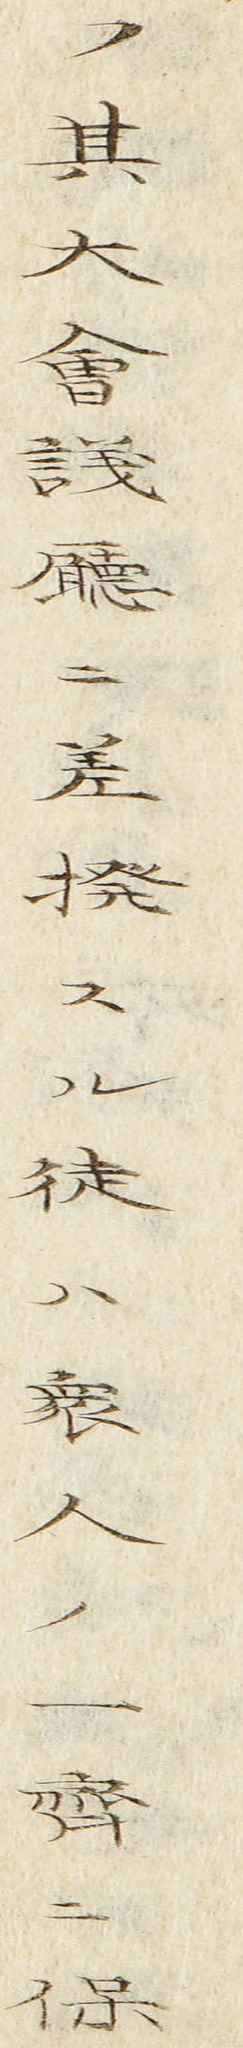ノ其大會議廳ニ差撥スル徒ハ衆人ノ一齊ニ保
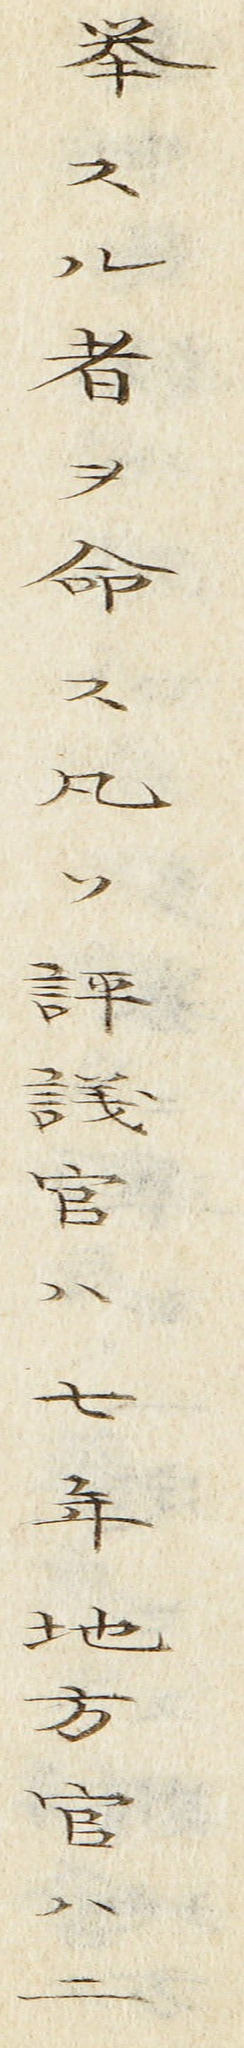挙スル者ヲ命ス凡ソ評議官ハ七年地方官ハ二
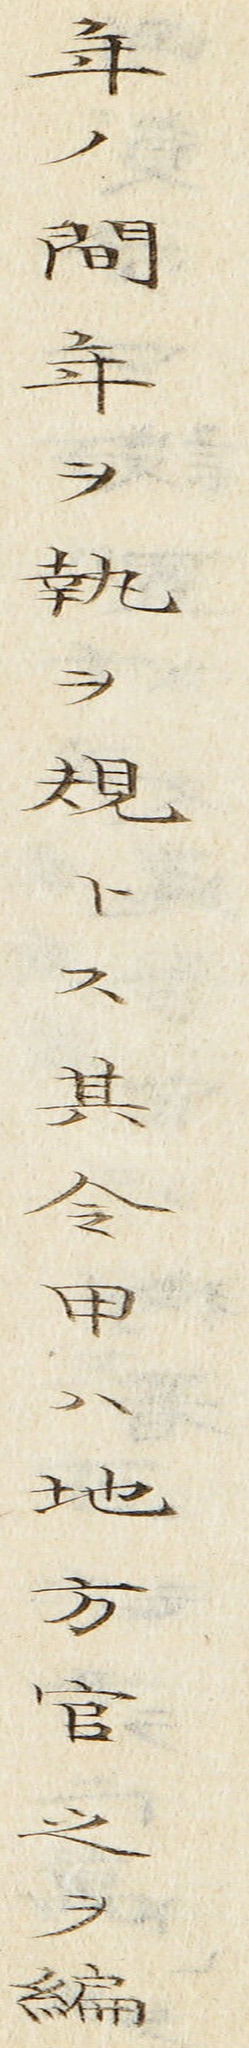年ノ間年ヲ執ヲ規トス其令甲ハ地方官之ヲ編
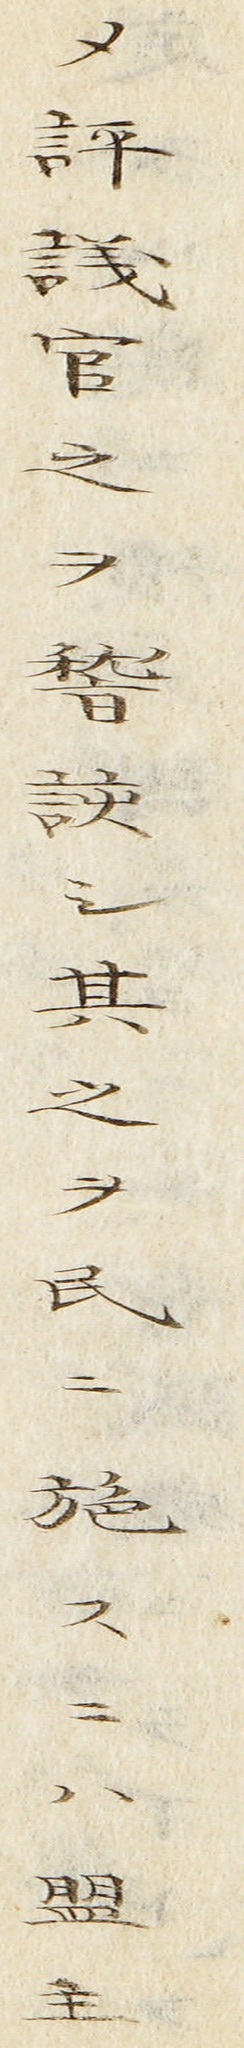シテ評議官之ヲ稽該シ其之ヲ民ニ施スニハ盟主
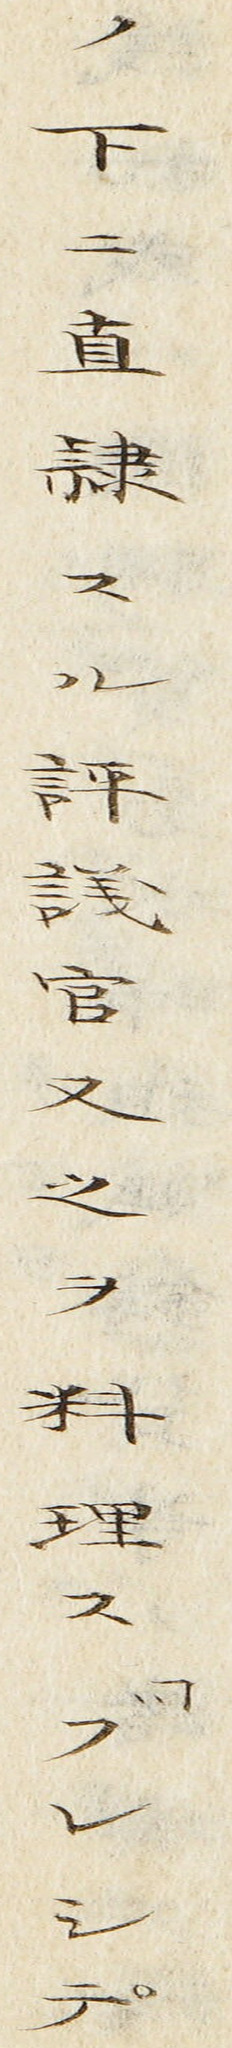ノ下ニ直隷スル評議官又之ヲ料理ス「ブレシデ
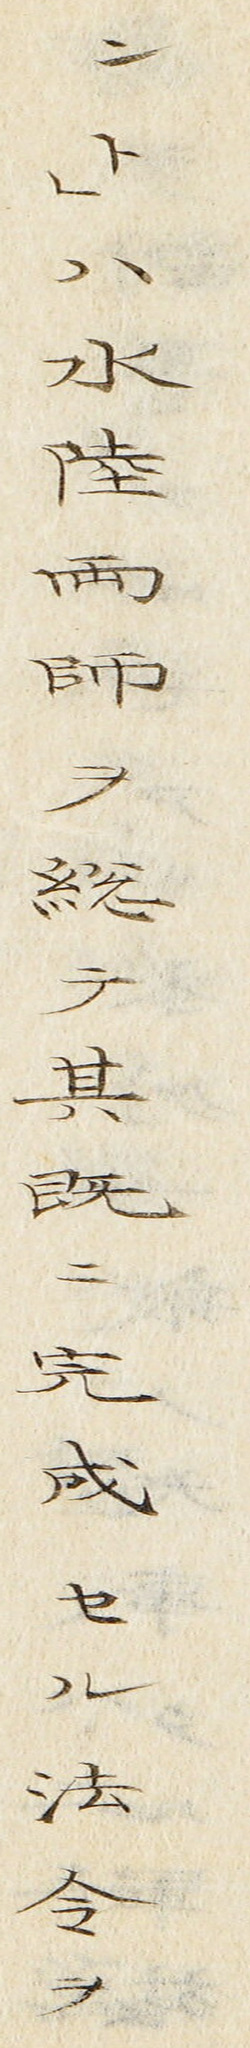ント」ハ水陸両師ヲ総テ其既ニ完成セル法令ヲ
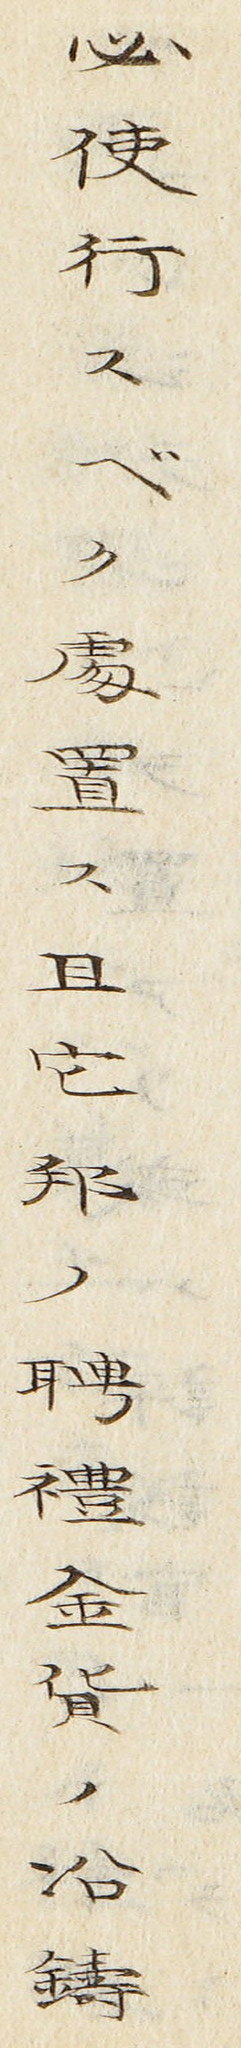必使行スベク䖏置ス且它邦ノ聘禮金貨ノ沿鑄
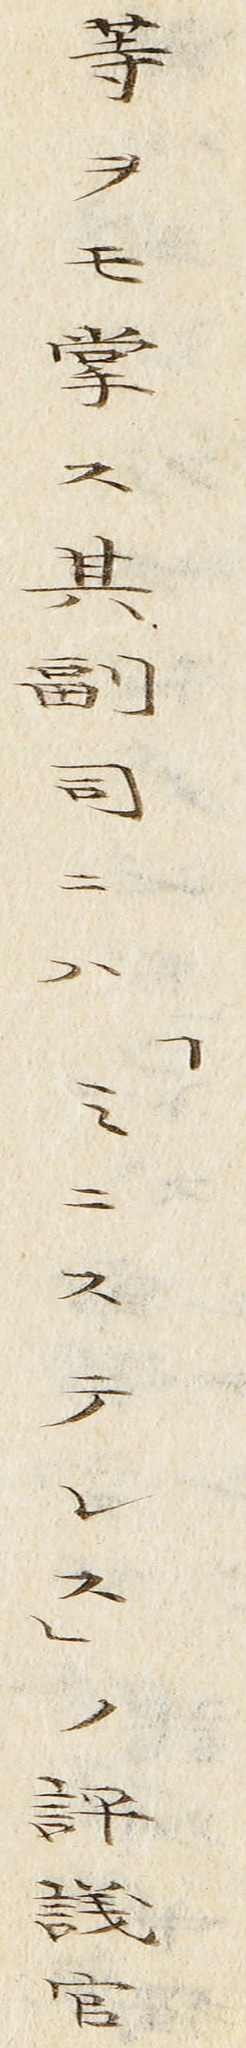等ヲモ掌ス其副司ニハ「ミニステレス」ノ評議官
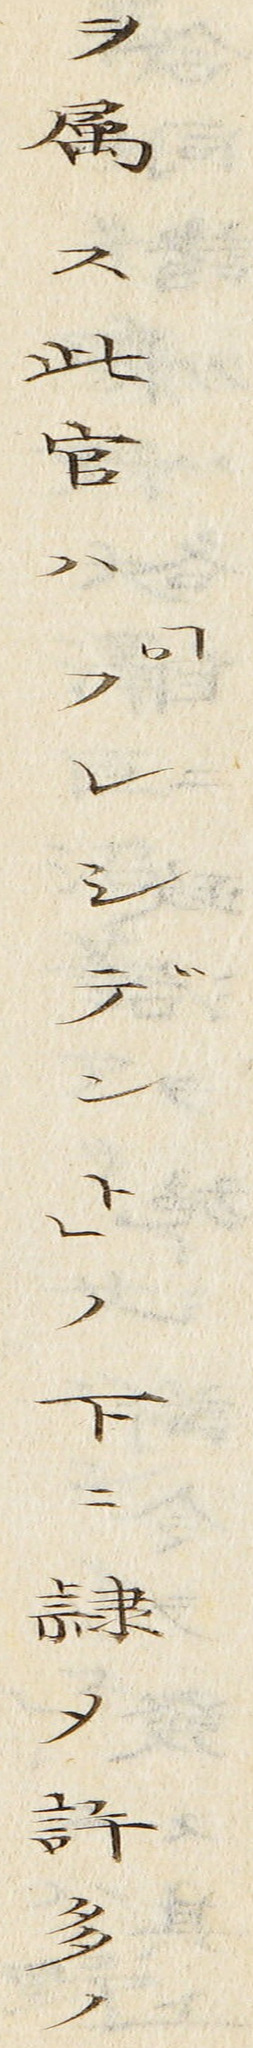ヲ属ス此官ハ「プレシデント」ノ下ニ隷シテ許多ノ
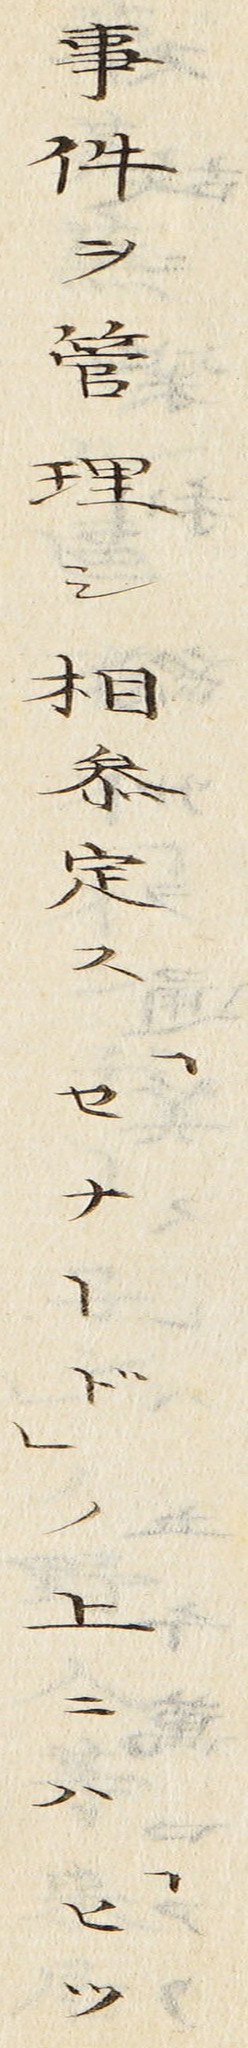事件ヲ管理シ相叅定ス「セナード」ノ上ニハ「ヒツ
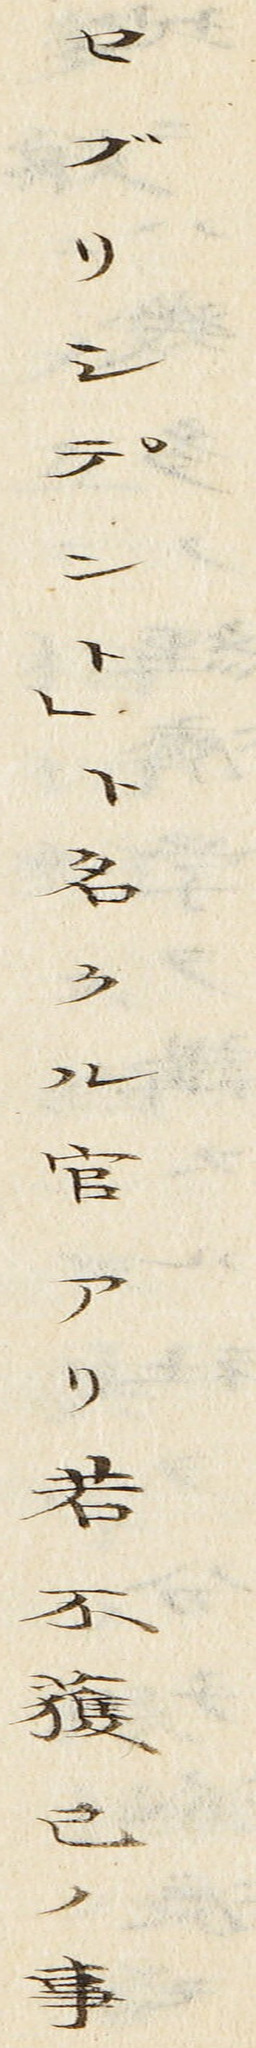センブリシデント」ト名クル官アリ若不獲已ノ事
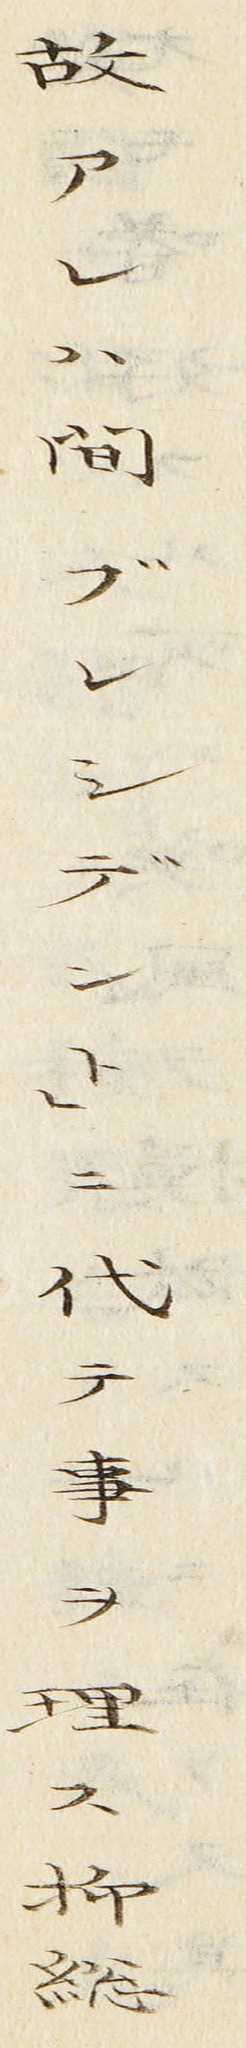故アレハ間ブレシデント」ニ代テ事ヲ理ス抑総
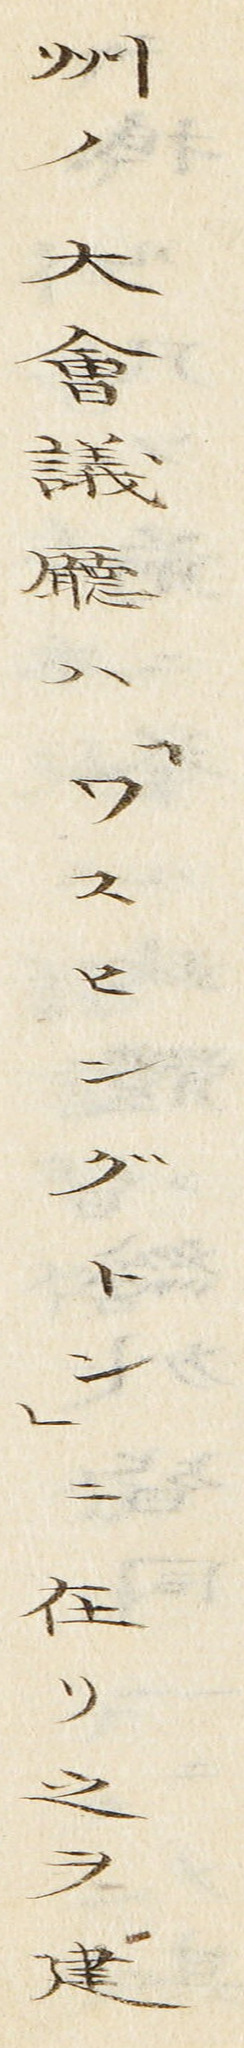州ノ大會議廳ハ「ワスヒングトン」ニ在リ之ヲ建
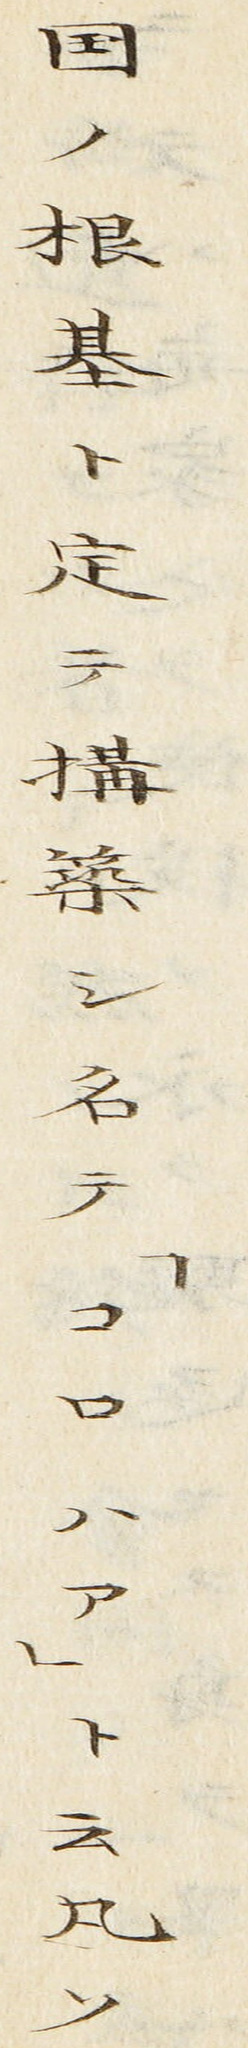国ノ根基ト定テ構築シ名テ「コロハア」ト云凡ソ
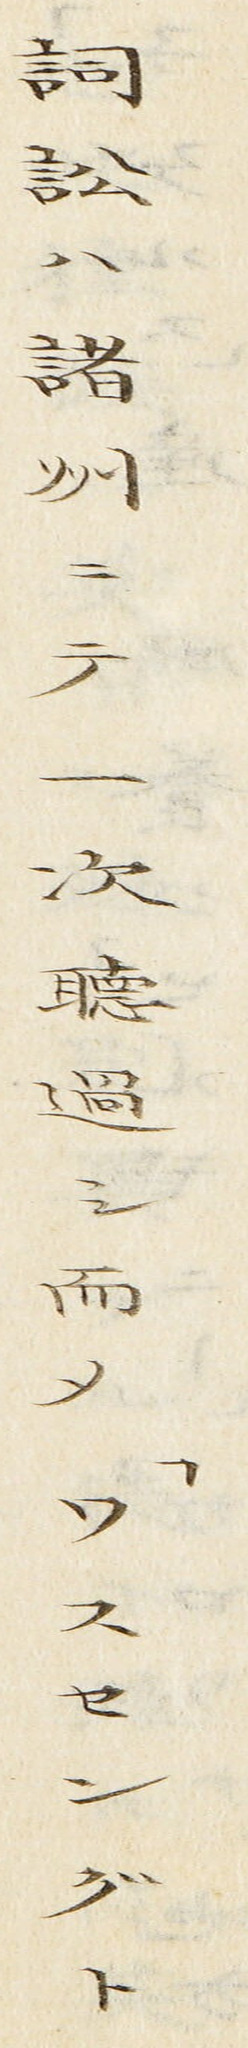詞訟ハ諸州ニテ一次聴過シ而シテ「ワスセングト
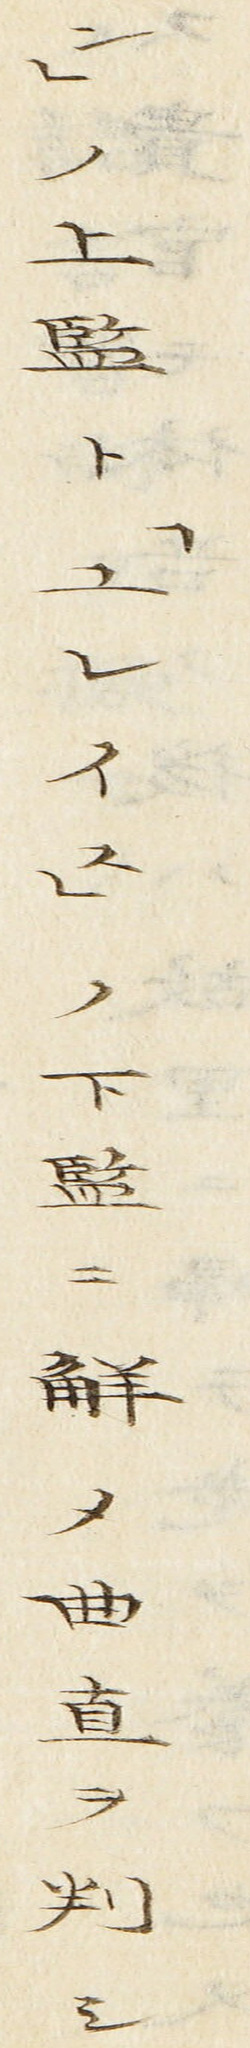ン」ノ上監ト「ユレイス」ノ下監ニ觧シテ曲直ヲ判シ
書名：蕃談
